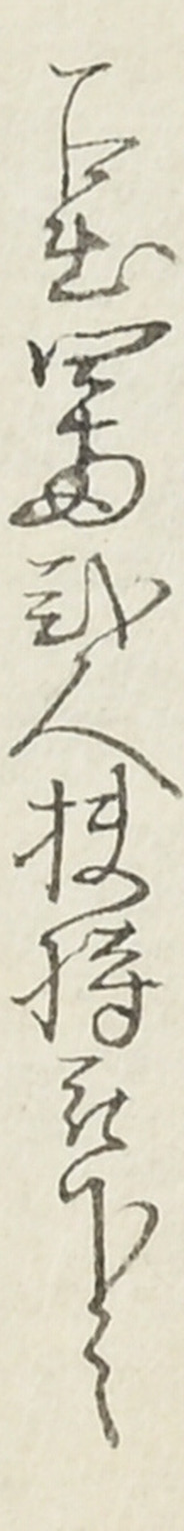召出四両弐人扶持被下之
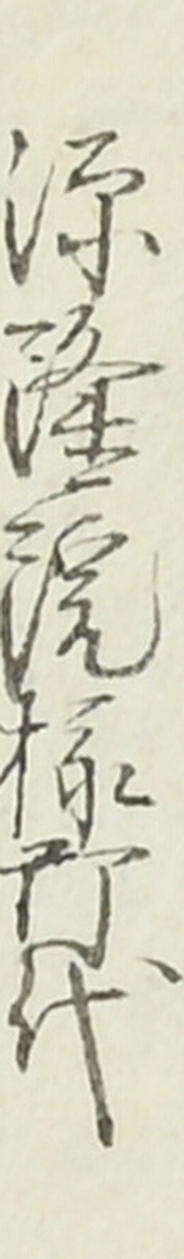源隆院様御代
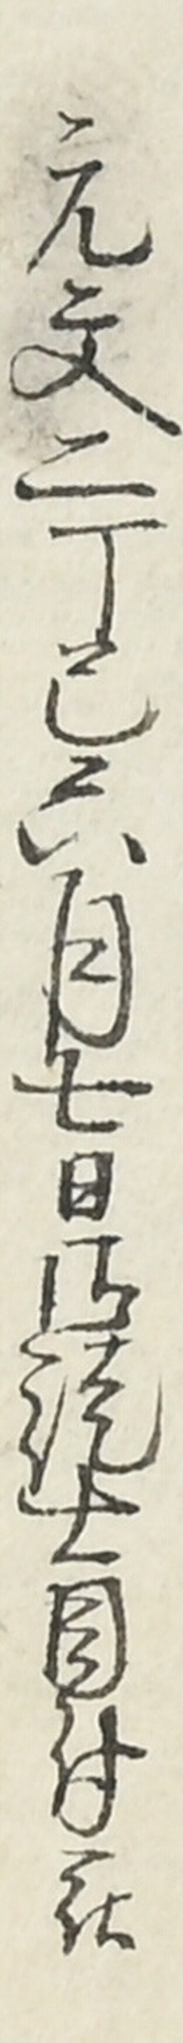一元文二丁巳六月七日御徒士目付被
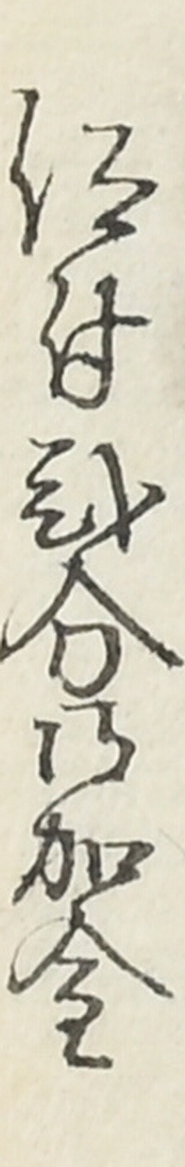仰付弐分御加金

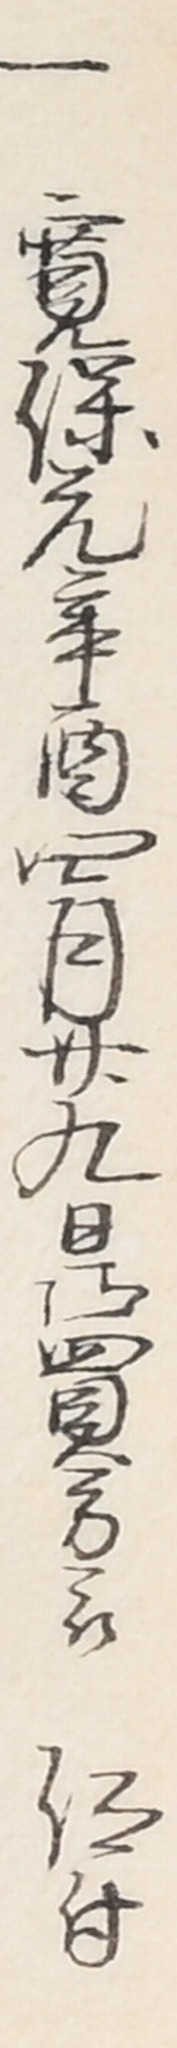一寛保元辛酉四月廿九日御買方被仰付
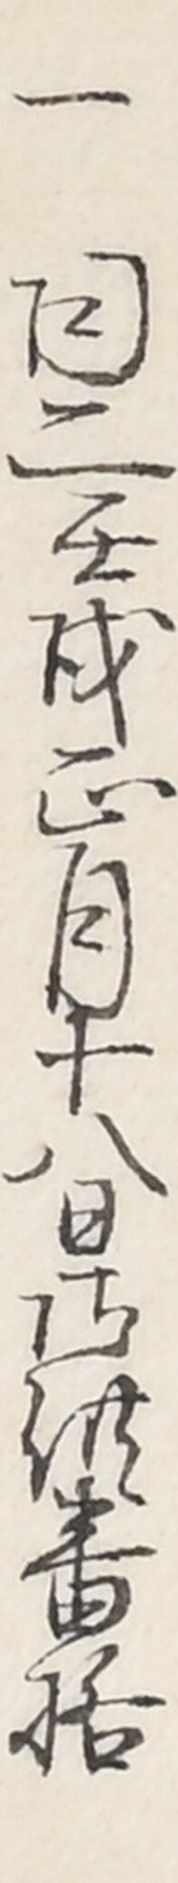一同二壬戌正月十八日御供番格
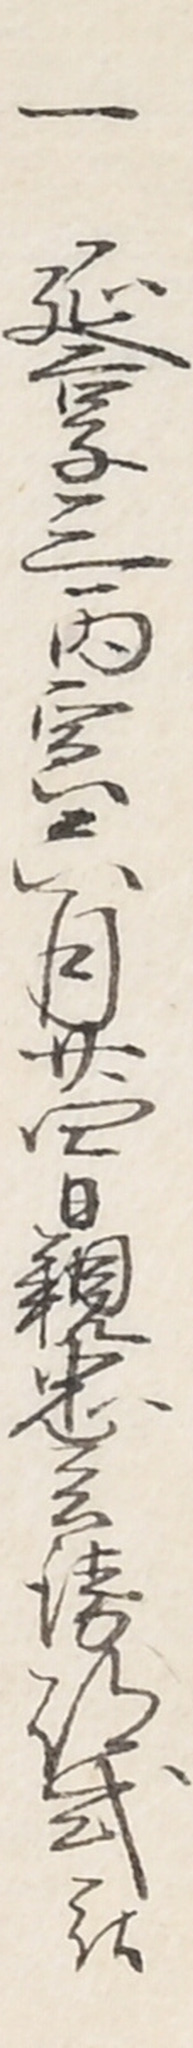一延享三丙寅六月廿四日親忠兵衛跡式被
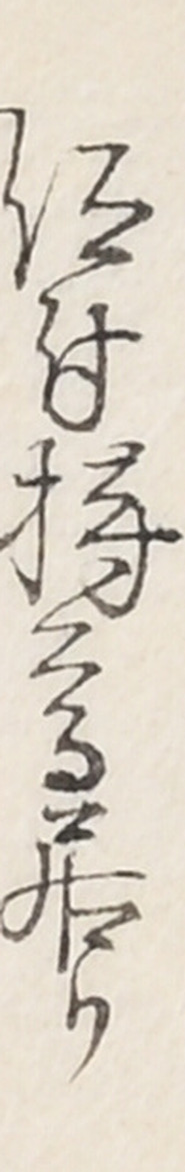仰付持高居り
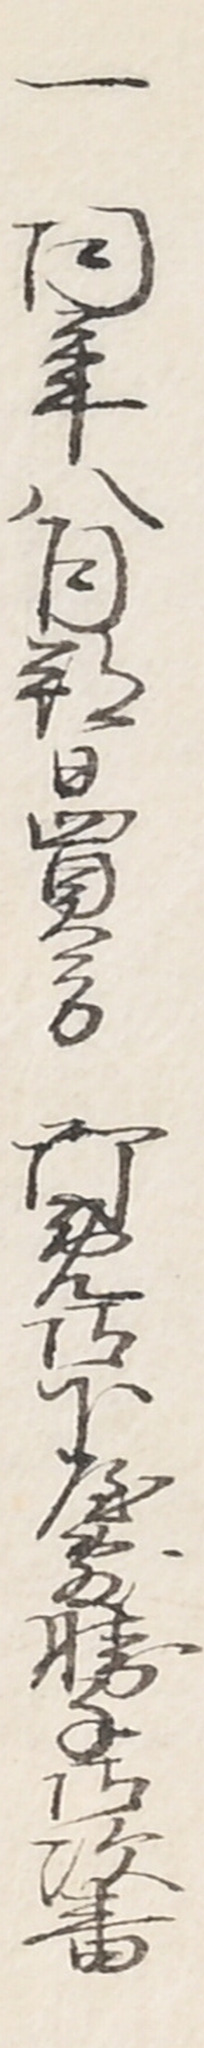一同年八月朔日買方御免御下屋敷勝手御次番
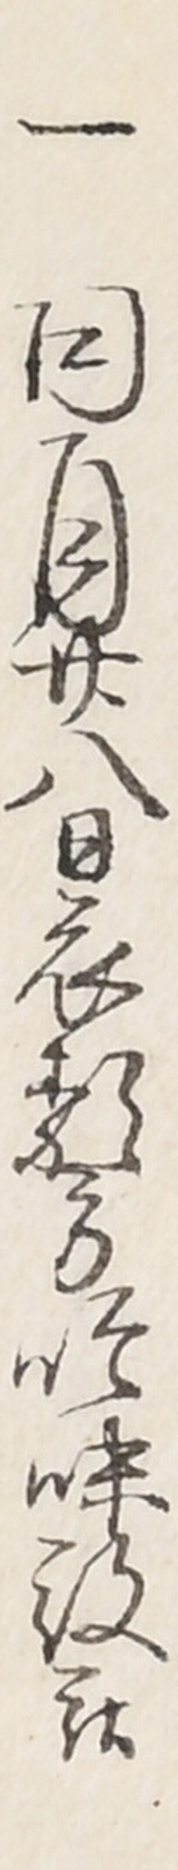一同月廿八日衣類方吟味役被
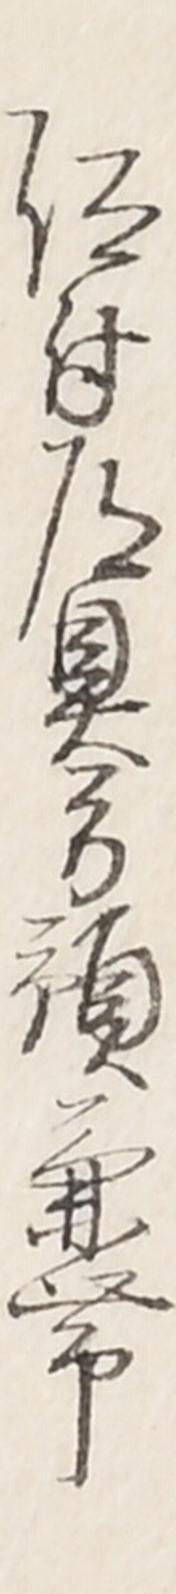仰付道具方預兼帯
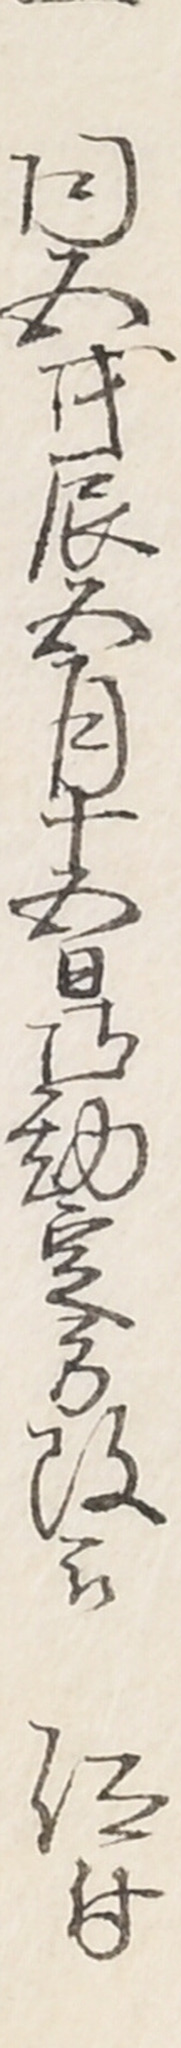一同五戊辰五月十五日御勘定方改被仰付
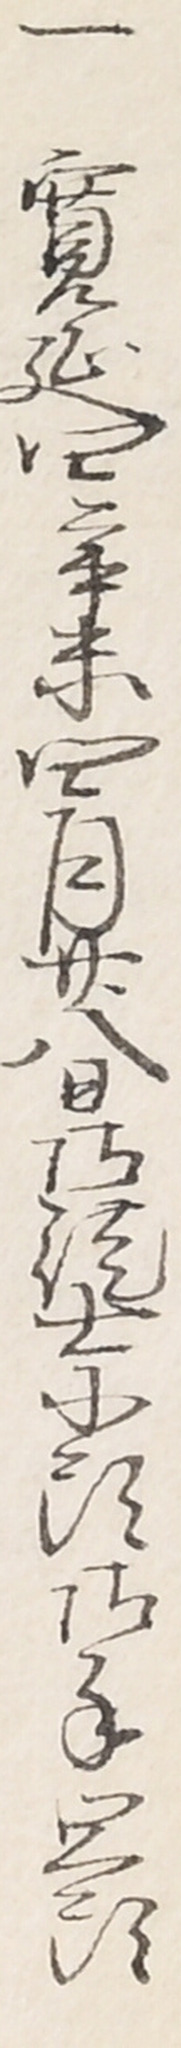一寛延四辛未四月廿八日御徒士小頭御手廻頭
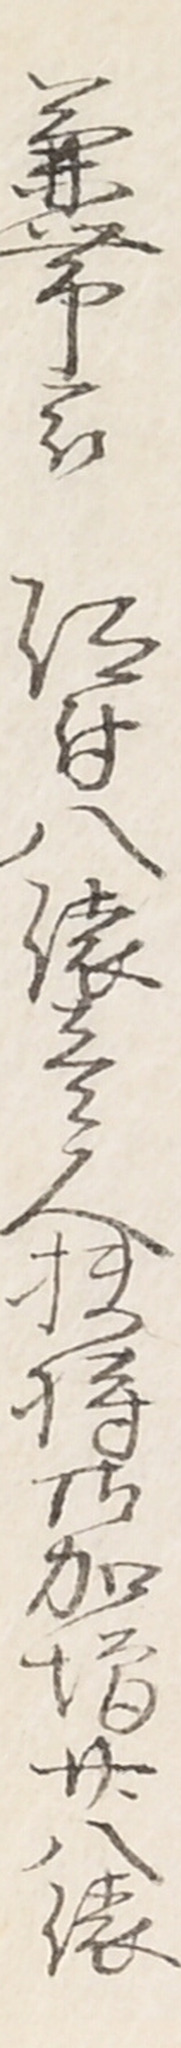兼帯被仰付八俵壱人扶持御加増廿八俵
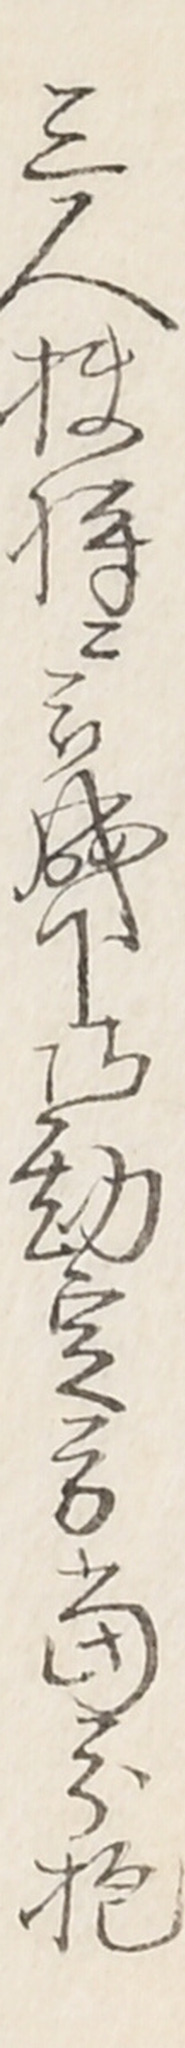三人扶持ニ被成下御勘定方当分抱
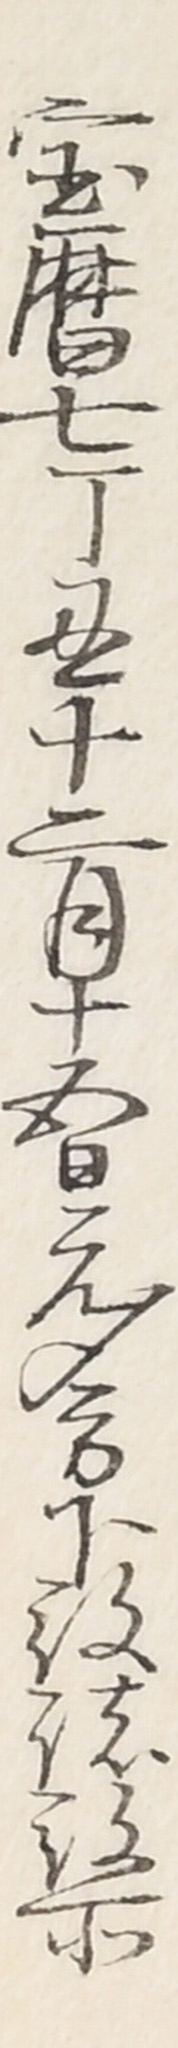一宝暦七丁丑十二月十五日元〆方下役諸役所
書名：無足諸士勤仕録（四）
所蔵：伊那市立高遠町図書館・合同会社AMANE
